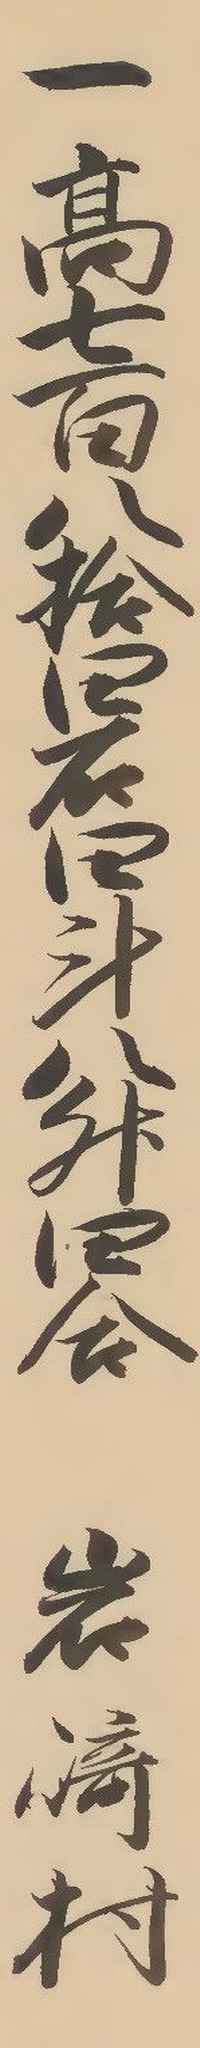一高七百八拾四石四斗八升四合岩崎村
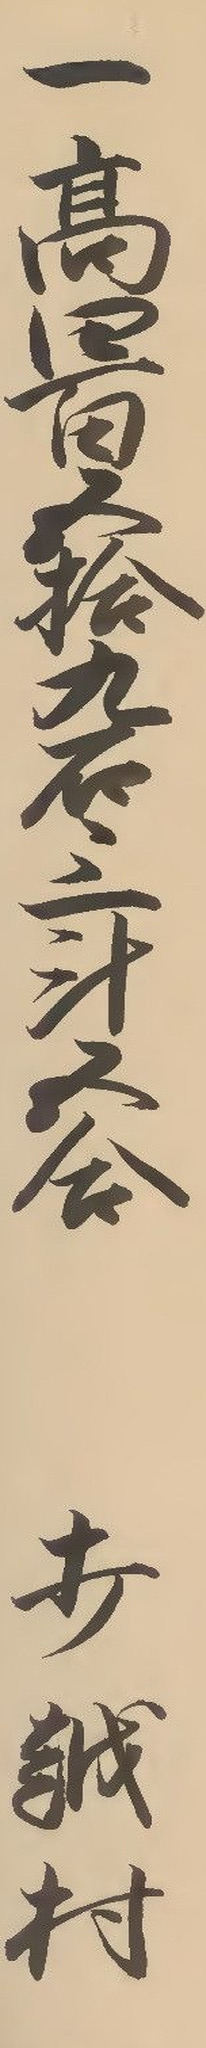一高四百五拾九石三斗五合打越村
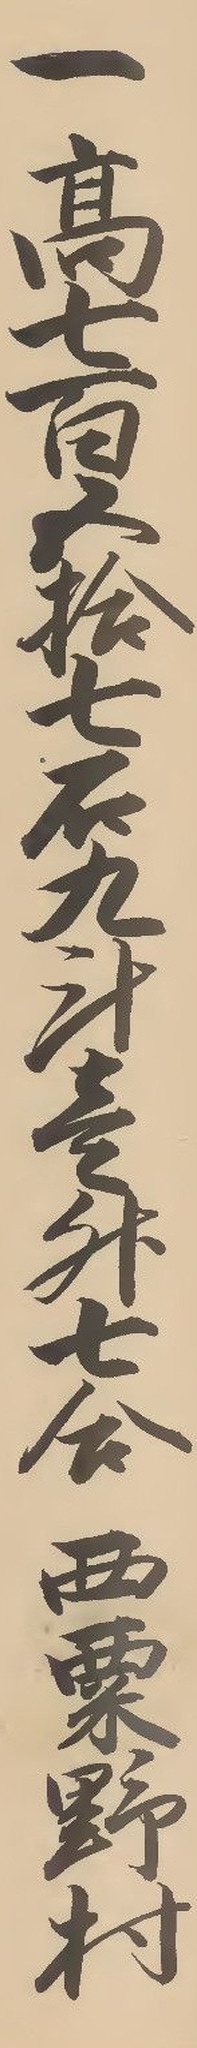一高七百五拾七石九斗壱升七合西粟野村
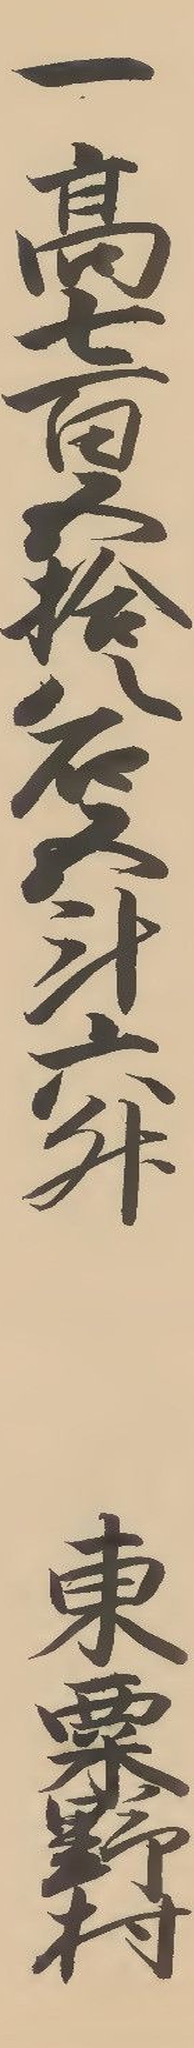一高七百五拾八石五斗六升東粟野村
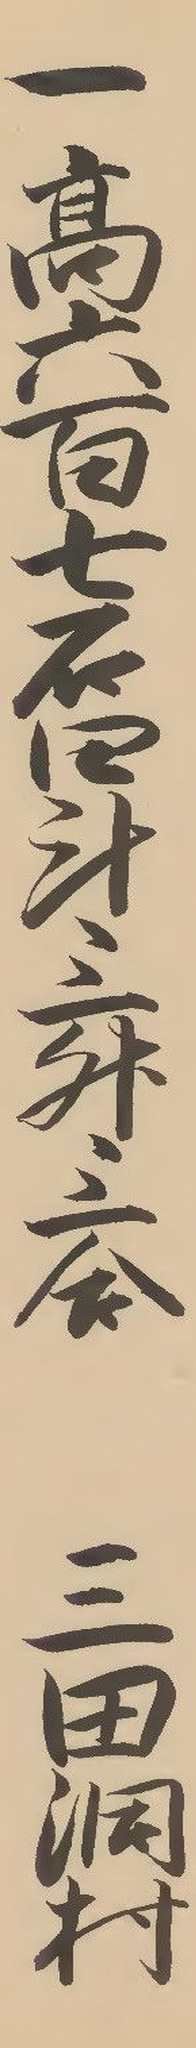一高六百七石四斗三升三合三田洞村

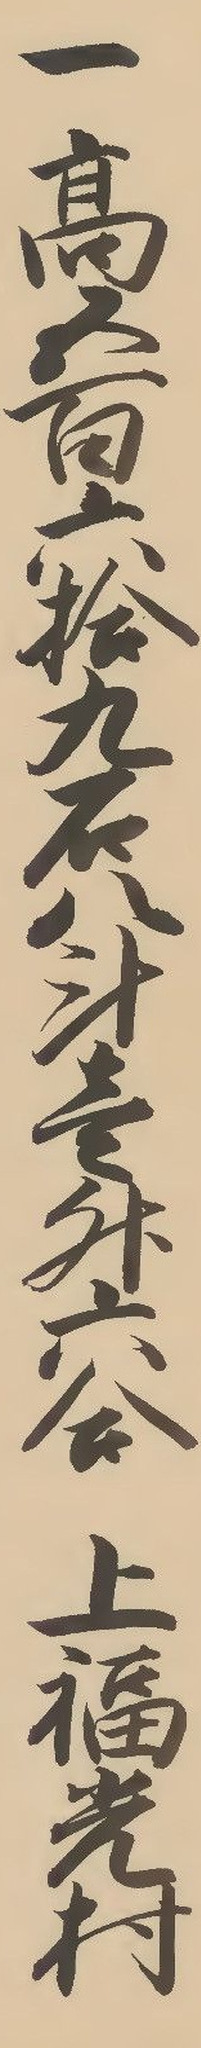一高五百六拾九石八斗壱升六合上福光村
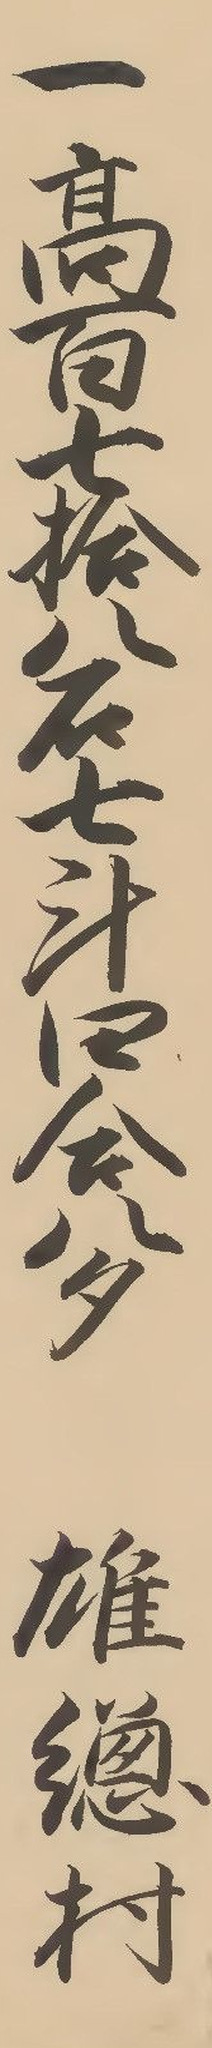一高百七拾八石七斗四合八勺雄総村
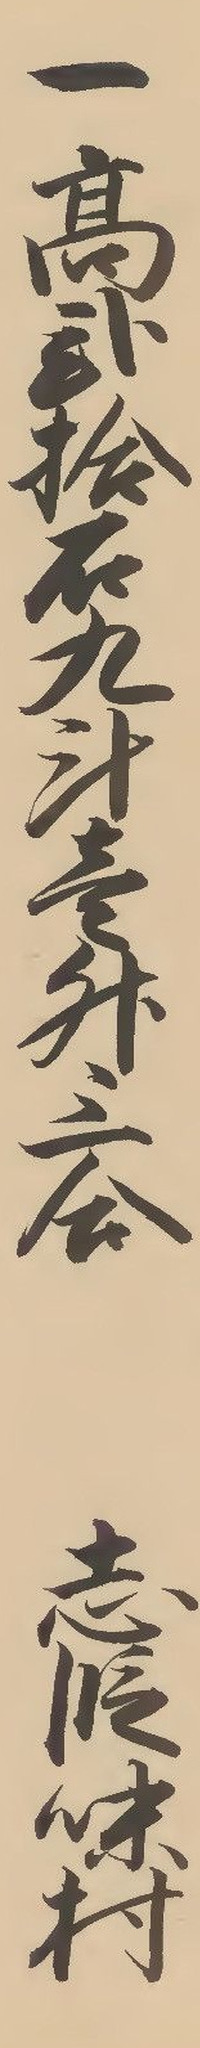一高弐拾石九斗壱升三合志段味村
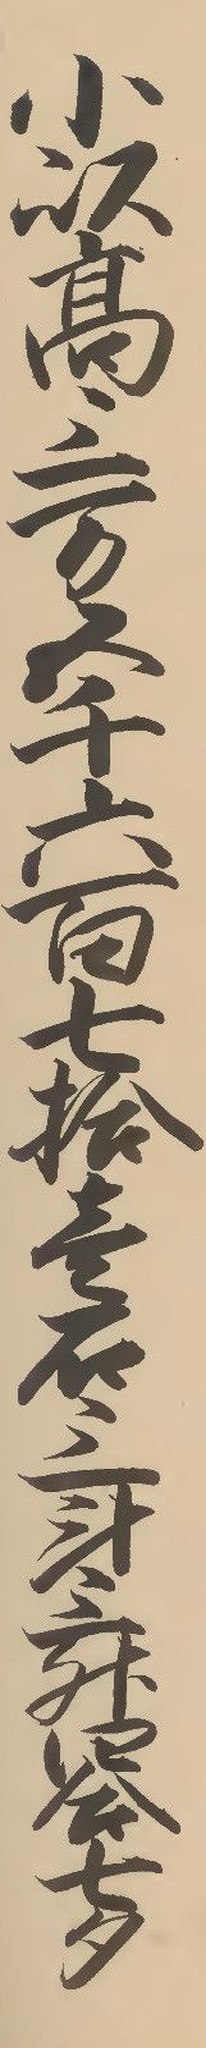小以高三万五千六百七拾壱石三斗三升四合七勺

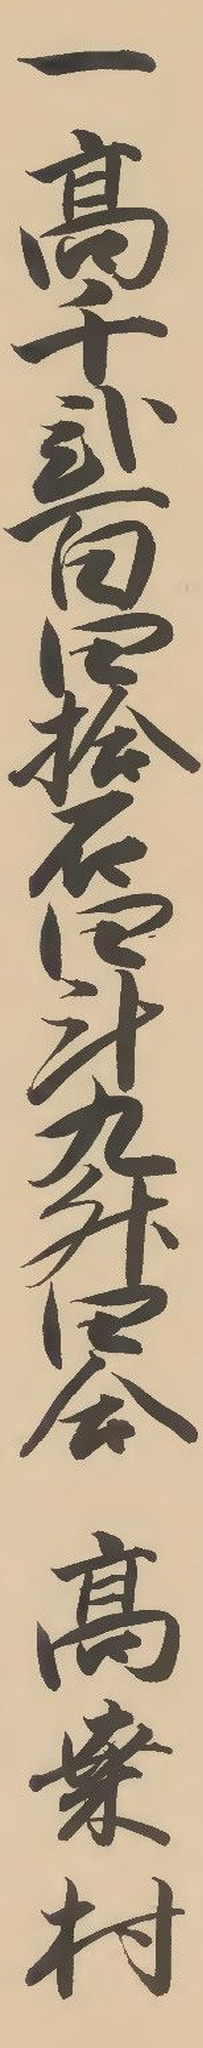一高千弐百四拾石四斗九升四合高桑村
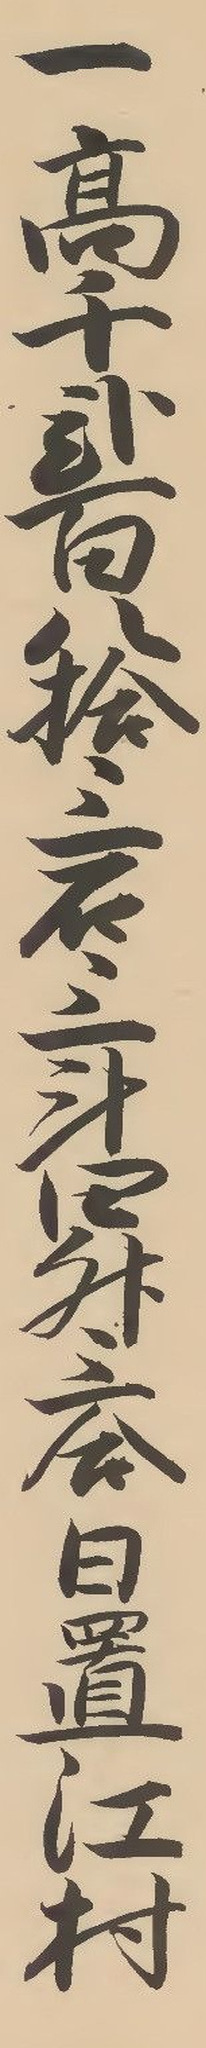一高千弐百八拾三石三斗四升三合日置江村
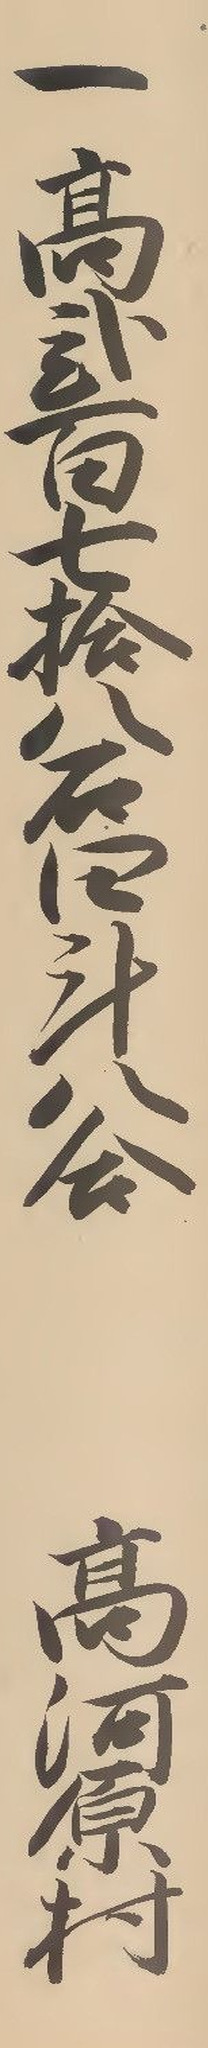一高弐百七拾八石四斗八合高河原村
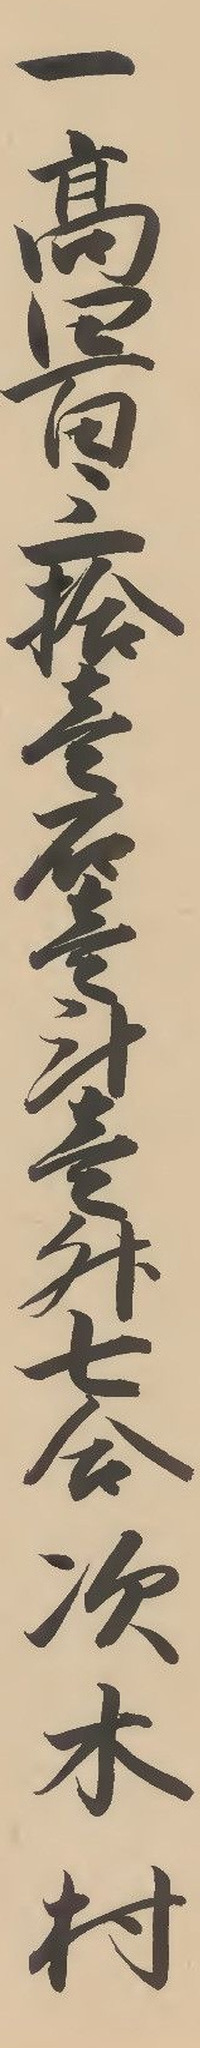一高四百三拾壱石壱斗壱升七合次木村
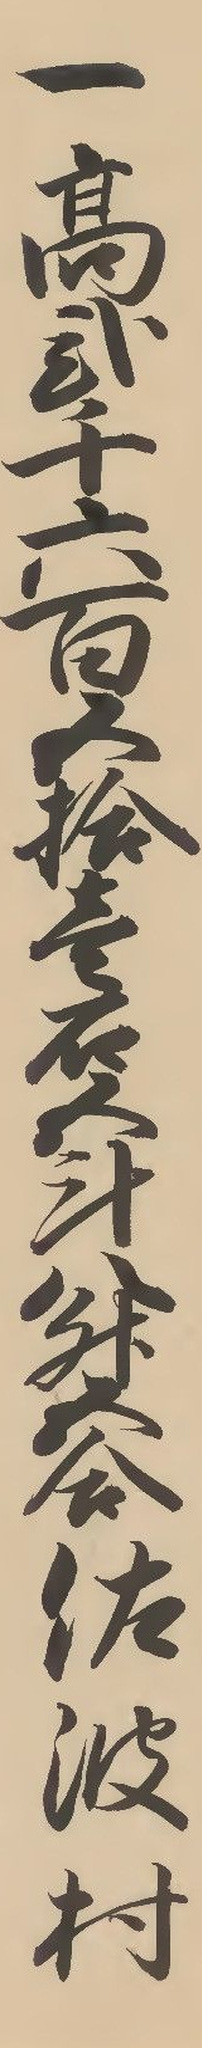一高弐千六百五拾壱石五斗八升五合佐波村
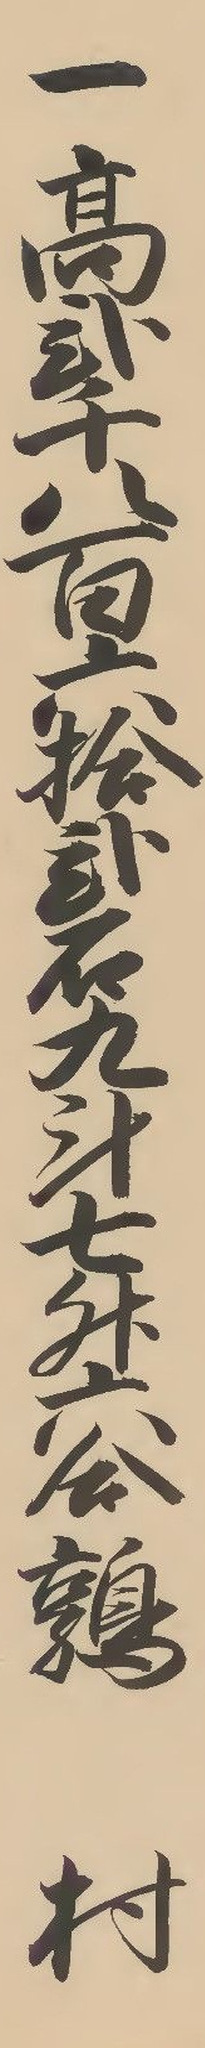一高弐千八百六拾弐石九斗七升六合鶉村

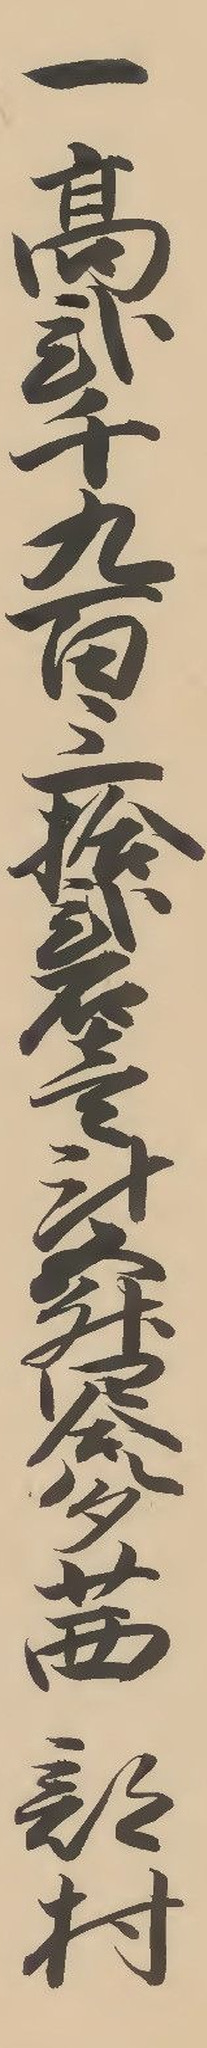一高弐千九百三拾弐石壱斗五升四合八勺茜部村
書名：美濃国郷帳
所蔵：国立公文書館 National Archives of Japan
